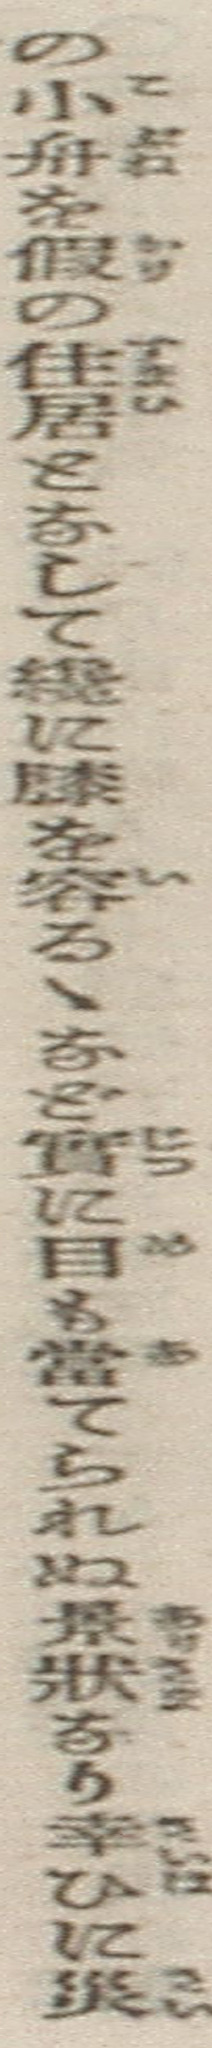の小舟を仮の住居となして僅に膝を容るゝなど実に目も当てられぬ景状なり幸ひに災
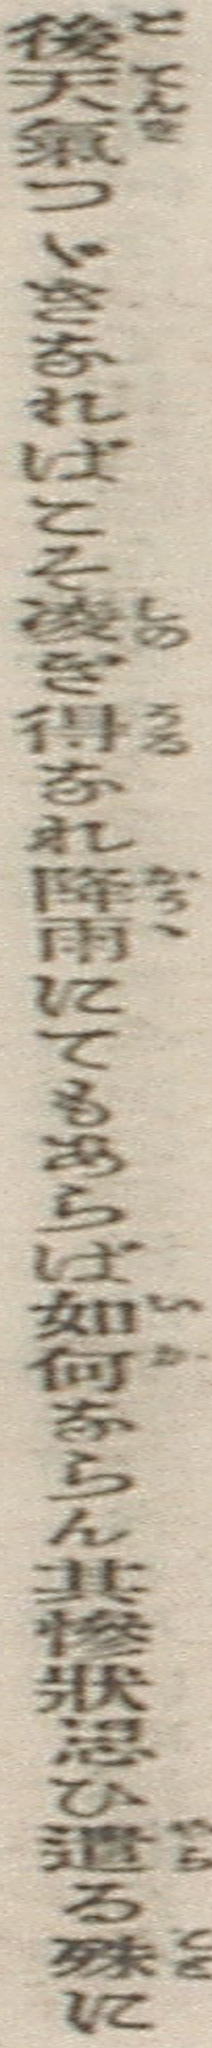後天気つゞきなればこそ凌ぎ得なれ降雨にてもあらば如何ならん其惨状思ひ遣る殊に
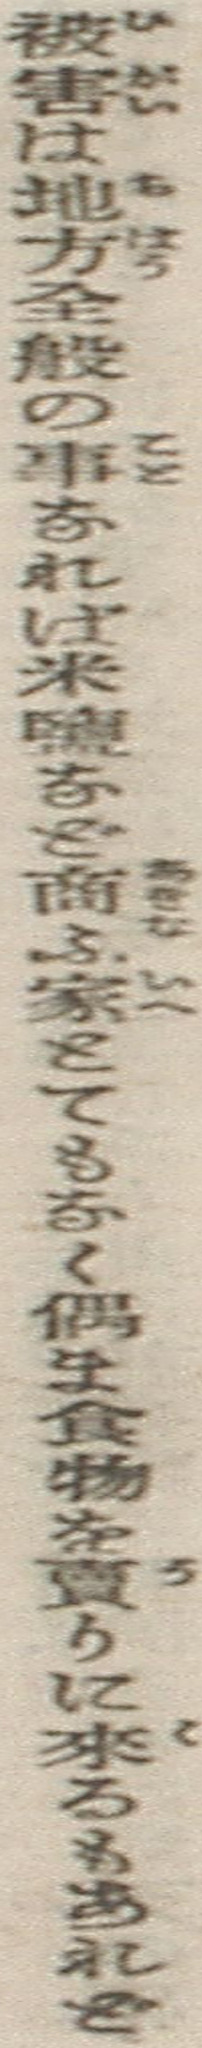被害は地方全般の事なれば米塩など商ふ家とてもなく偶ま食物を売りに来るもあれど
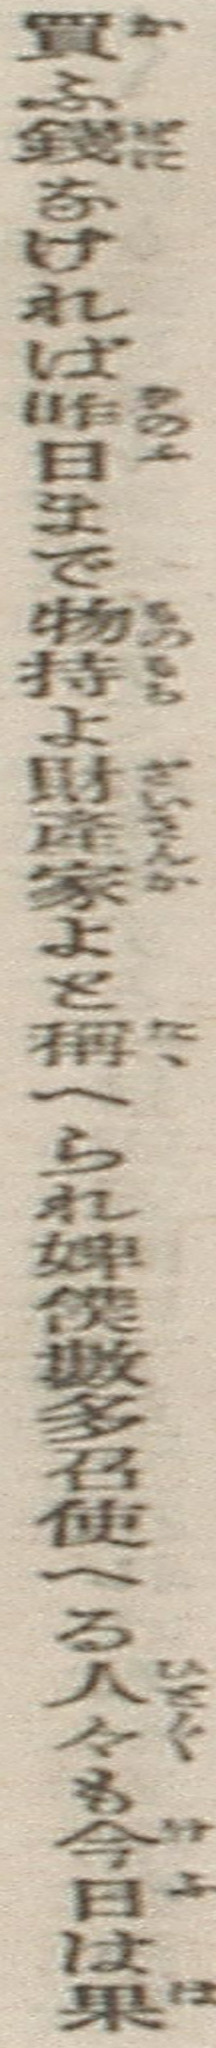買ふ銭なければ昨日まで物持よ財産家よと称へられ婢僕数多召使へる人々も今日は果
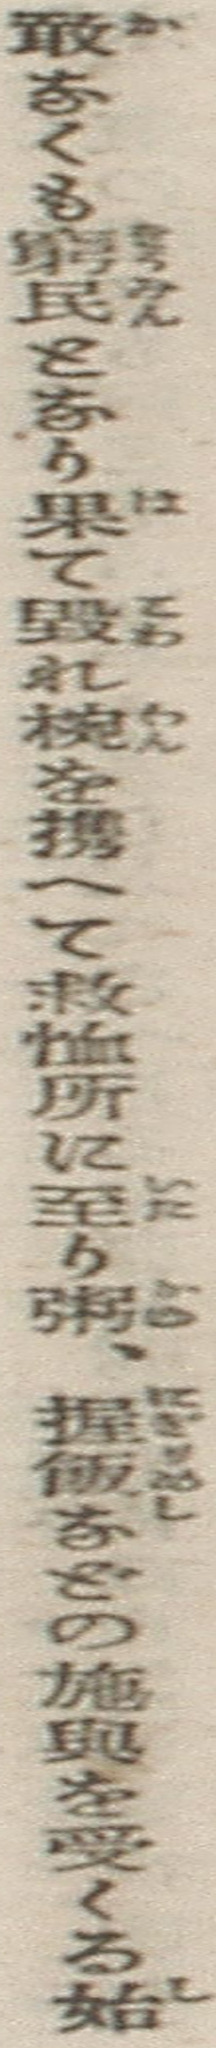敢なくも窮民となり果て毀れ椀を携へて救恤所に至り粥、握飯などの施与を受くる始

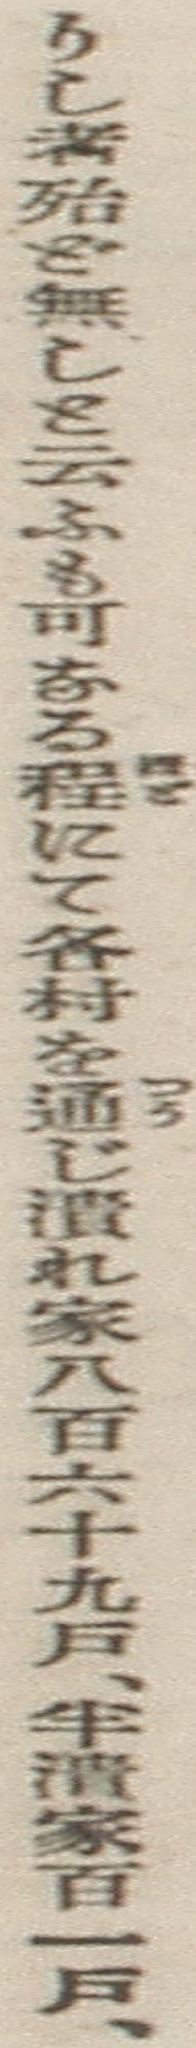りし者殆ど無しと云ふも可なる程ほどにて各村を通つうじ潰れ家八百六十九戸、半潰家百一戸、

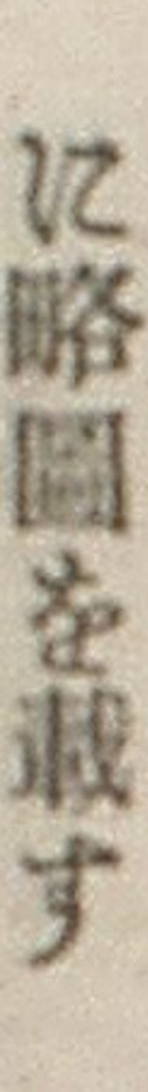に略図を載す
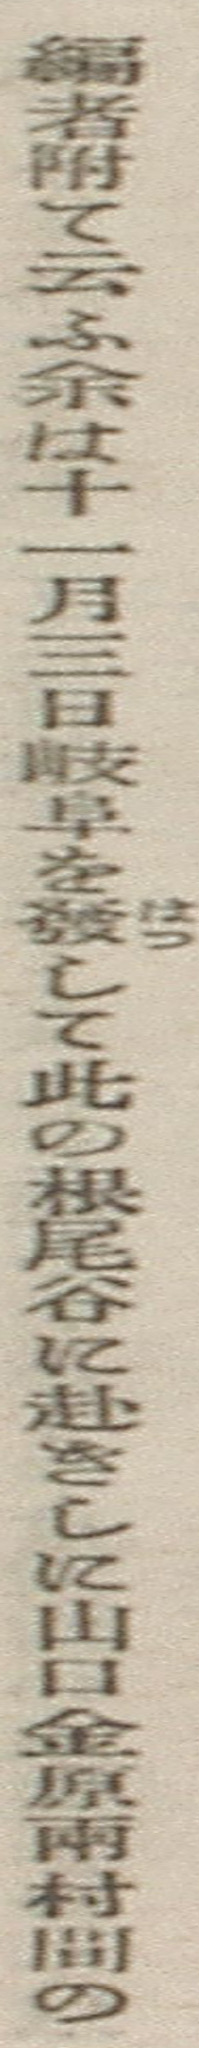編者附きて云ふ余は十一月三日岐阜を発はつして此の根尾谷に赴きしに山口金原両村間の
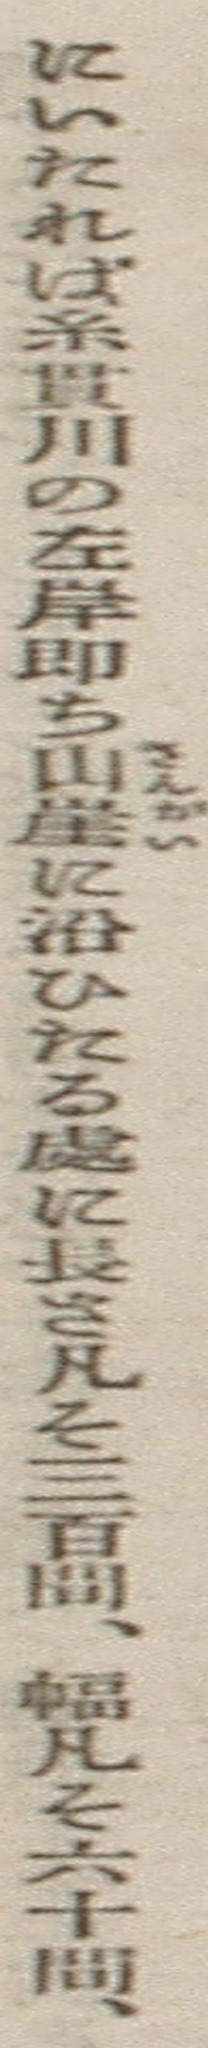にいたれば糸貫川の左岸即ち山崖さんがいに沿ひたる処に長さ凡そ三百間、幅凡そ六十間、

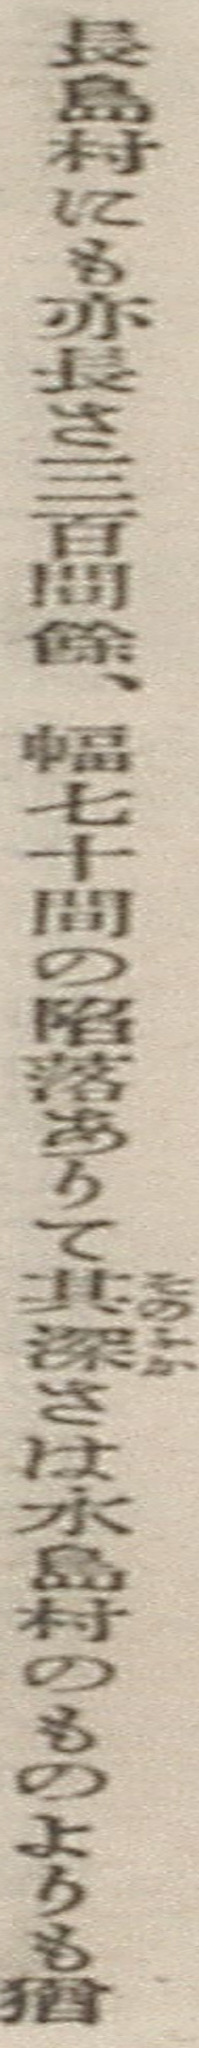長島村にも亦長さ三百間余、幅七十間の陥落ありて其深そのふかさは水島村のものよりも猶

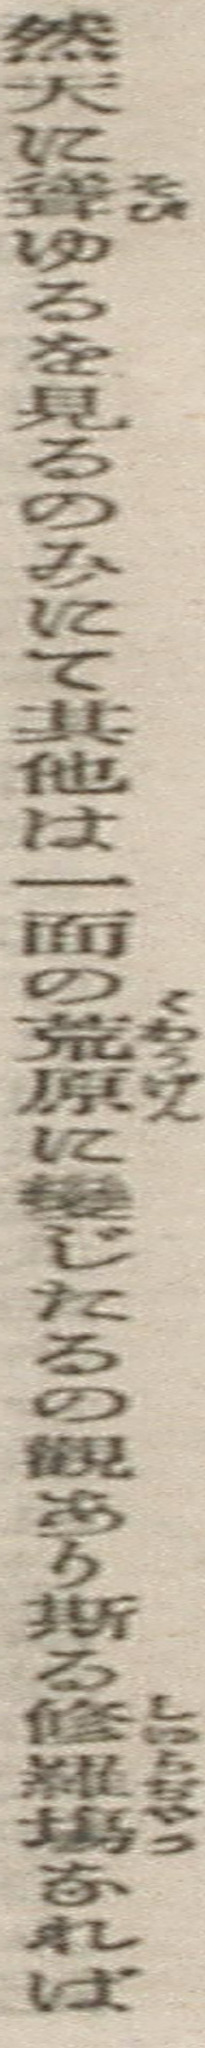然天に聳ゆるを見るのみにて其他は一面の荒原に変じたるの観あり斯る修羅場なれば
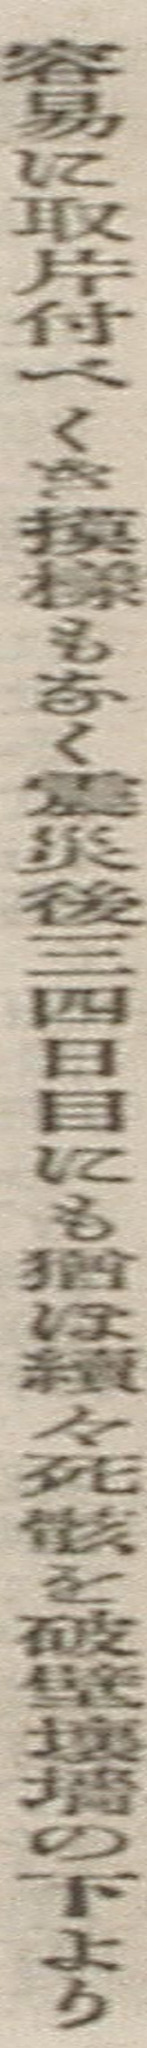容易に取片付べくき模様もなく震災後三四日目にも猶ほ続々死骸を破壁壊墻の下より
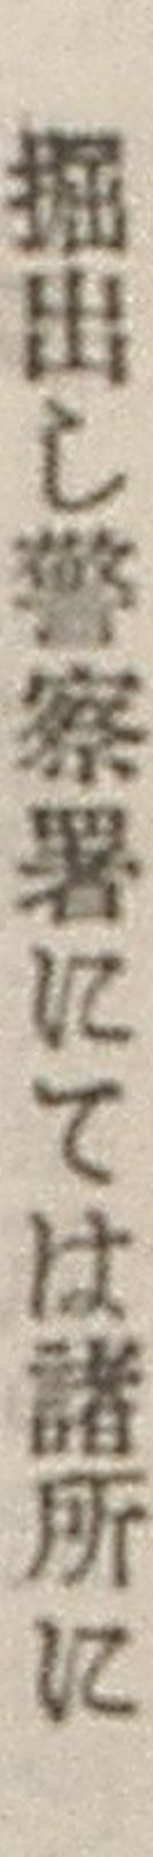掘出し警察署にては諸所に
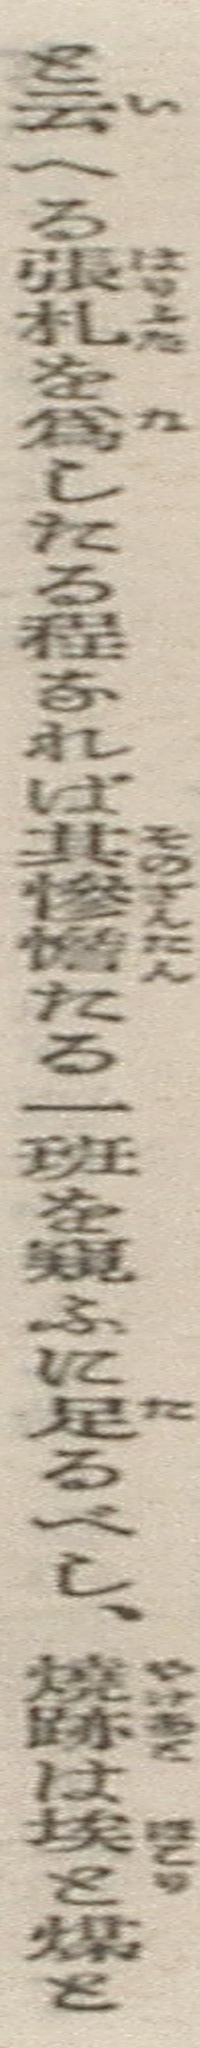と云へる張札を為したる程なれば其惨憺たる一班を窺ふに足るべし、焼跡は埃と煤と
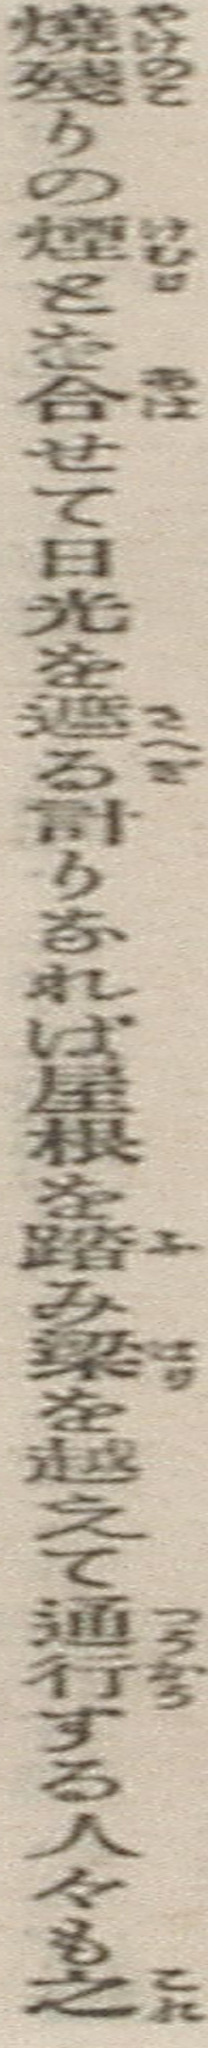焼残りの煙とを合せて日光を遮る計りなれば屋根を踏み梁を越えて通行する人々も之
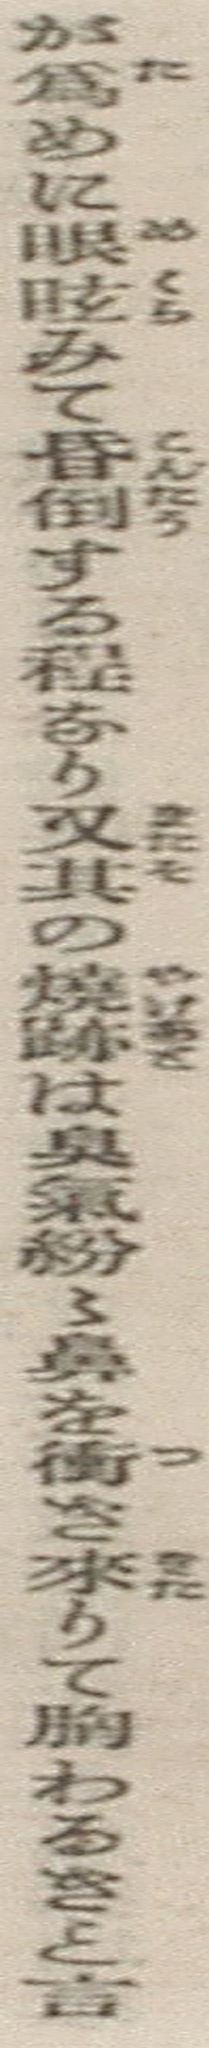が為めに眼眩みて昏倒する程なり又其の焼跡は臭気紛々鼻を衝き来りて胸わるきこと言
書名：愛知岐阜福井三県　大地震見聞録（内題）
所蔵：東京大学地震研究所図書室 Earthquake Research Institute Library, The University of Tokyo, JAPAN
